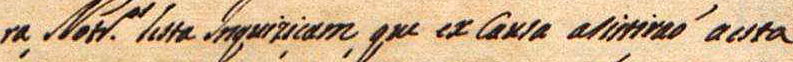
ra, Notr.o desta Inquiziçam, que ex Causa asistiraõ a esta
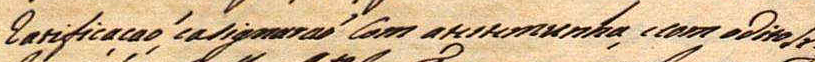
Ratificaçaõ, e asignaraõ Com a testemunha, e com o dito sr̄
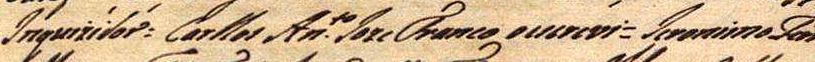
Inquizidor = Carllos An.to Ioze Franco o escrevi = Ieronimo Ferr.a
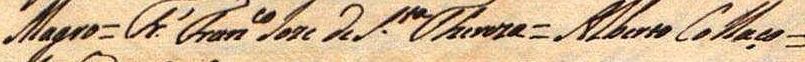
Magro = Fr̄ Fran.co Ioze de S.ta Thereza = Alberto Collaço =
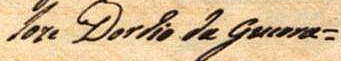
Ioze Dordio da Guerra =
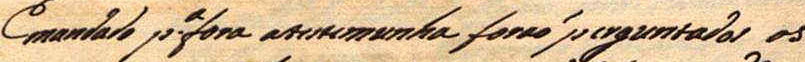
E mandado p.a fora a testemunha foraõ perguntados os
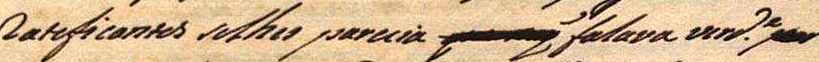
Rateficantes se lhes parecia _ falava verd.e
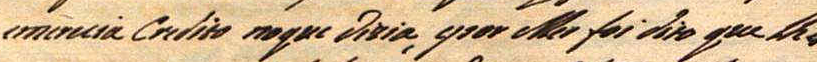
e merecia Credito no que dizia, e por elles foi dito que lhes
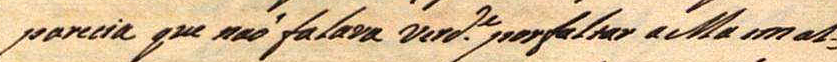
parecia que naõ falava verd.e por faltar a ella em al
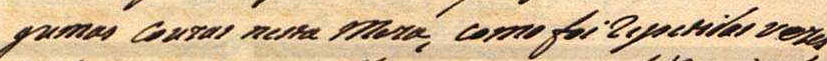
gumas couzas nesta Meza, como foi Repetidas vezes,
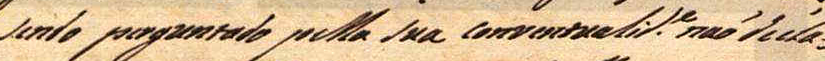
sendo perguntado pella sua conventualid.e naõ decla
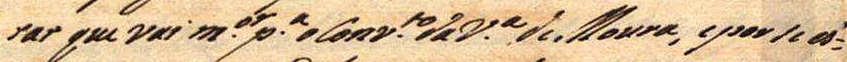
rar que vai m.or p.a o Conv.to da V.a de Moura, e por se es
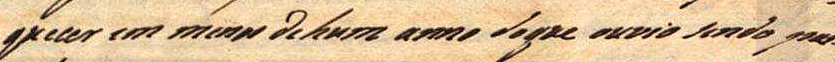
quecer em menos de hum anno do que ouvio sendo pas
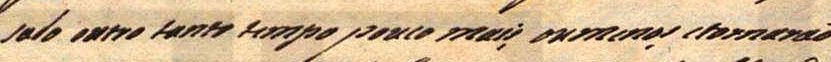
sado outro tanto tempo pouco mais, ou menos, e tornaraõ
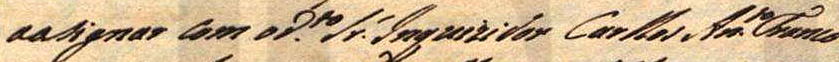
a asignar com o dito Sr̄ Inquizidor Carllos An.to Franco
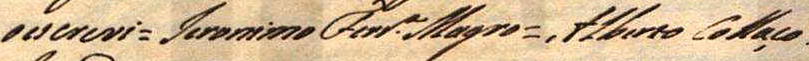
o escrevi = Ieronimo Ferr.a Magro = Alberto Collaço =
